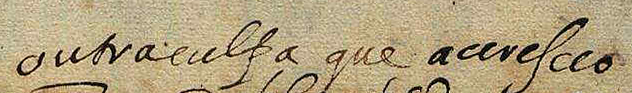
outra culpa que accresceo
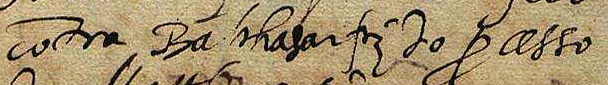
cōtra Balthasar frz̄ do ꝓcesso
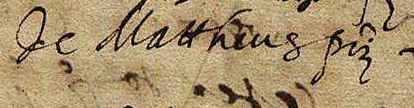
de Mattheus piz̄
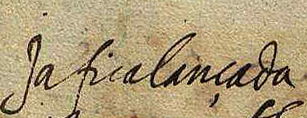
Ja fica lançada
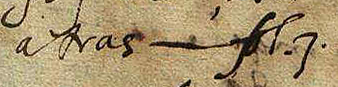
atras - fol. 7.
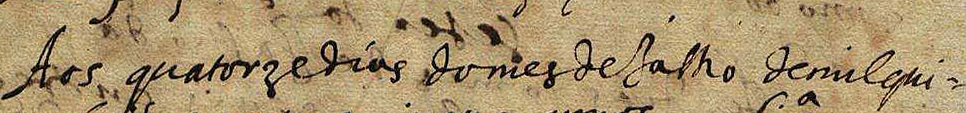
Aos quatorze dias do mes de Julho de mil qui
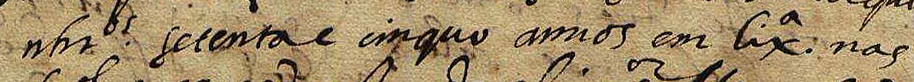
nhtos. setenta e cinquo annos em lixa. nas
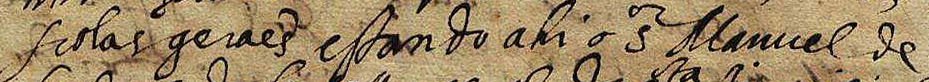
scolas geraēs estando ahi o sor Manuel de
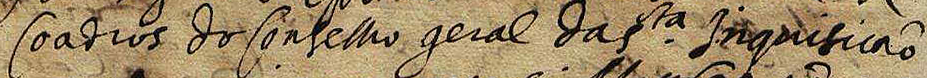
Coadros do Conselho geral da sta. Inquisiçaõ
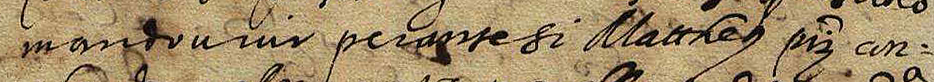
mandou uir perante si Mattheꝯ piz̄ con
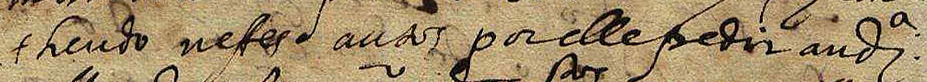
theudo nestes autos por elle pedir audja.
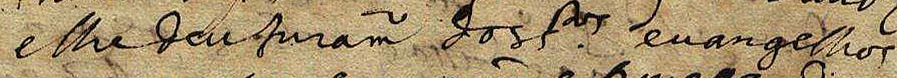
e lhe deu Iuramto dos stos. euangelhos
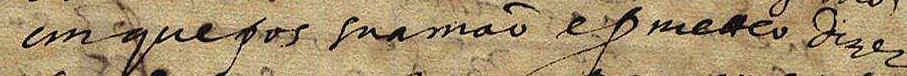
em que pos sua maõ e ꝓmetteo dizer
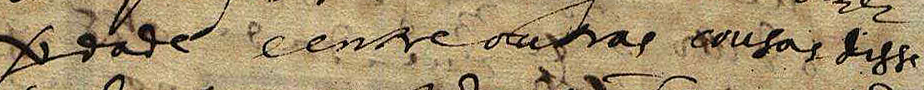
ꝟdade e entre outras cousas disse
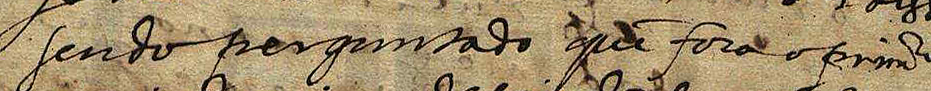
sendo perguntado quē fora o primro
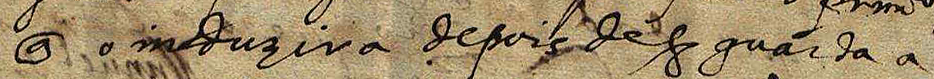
q̄ o induzira depois de ꞩ guarda a
